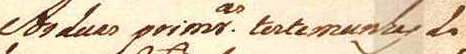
As duas primr.as testemunhas do
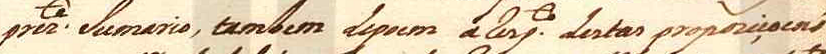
prezte. Sumario, tambem depoem a Resp.to destas propoziçoens̄
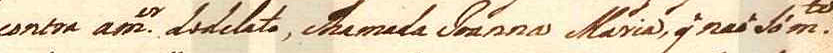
contra a m.er do delato, chamada Ioanna Maria, q̄ naõ sóm.te
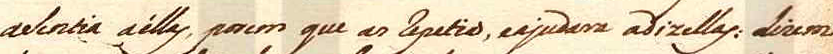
asentia a ellas, porem que as Repetia, e ajudava a dizellas: dizem
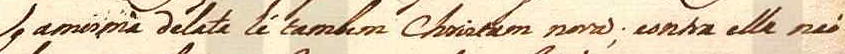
q̄ a mesma delata hé também Christam nova; contra elle naõ
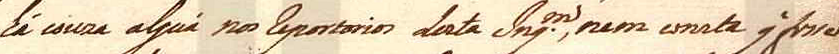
há couza alguã nos Repertorios desta Inq.m, nem consta q̄ fosse
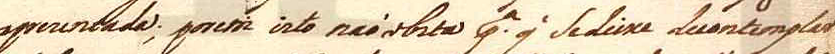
aprezentada; porem isto naõ obsta p.a q̄ se deixe de contemplar
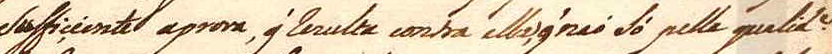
suffiçiente a prova, q̄ Rezulta contra ella, q̄ naõ só pella qualid.e
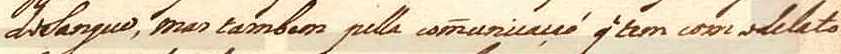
do Sangue, mas tambem pella com̄unicaçaõ q̄ tem com o delato
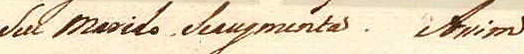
seu marido, se augmenta. Assim
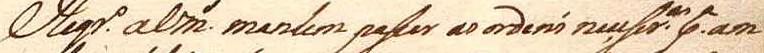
Reqr.o a Vm.e mandem passar as ordens̄ naçessr.as p.a am
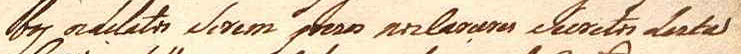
bos os delatos serem presos nos Carçeres Secretos desta
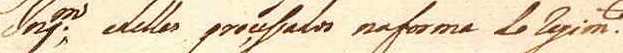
Inq.m; e dellas proçessados na forma do Regim.to
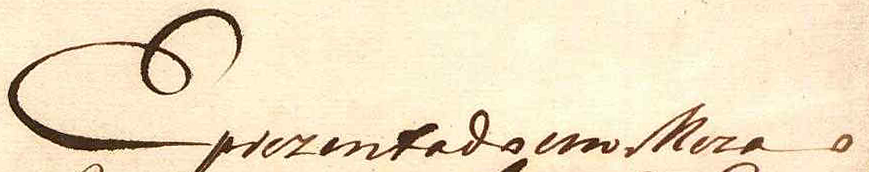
E prezentado em Meza o
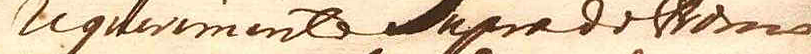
requerimento supra do Promo
